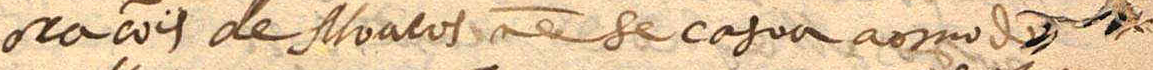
oracõis de Mouros nē se casou ao modo
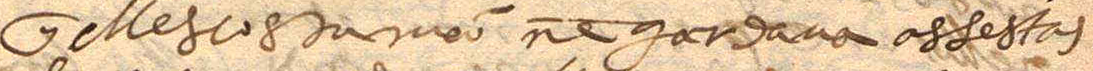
q̄ elles costumaõ nē gardaua as sestas
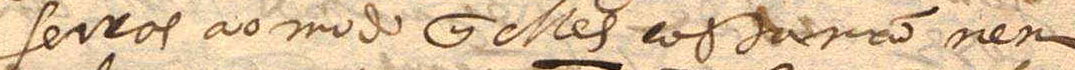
feiras ao modo q̄ elles costumaõ nem
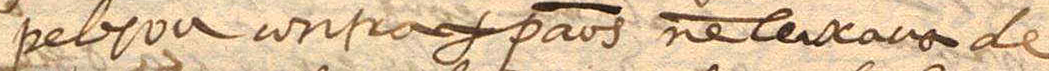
pelejou contra Xpãos nē leixaua de
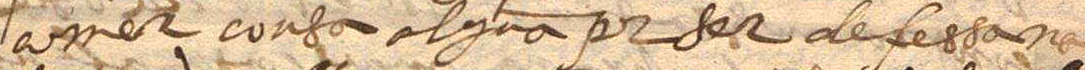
comer cousa algūa por ser defessa na
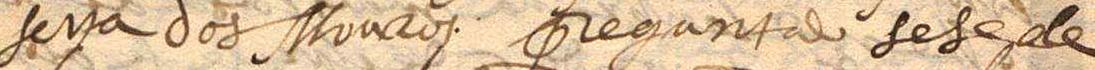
seita dos Mouros. preguntado se se de
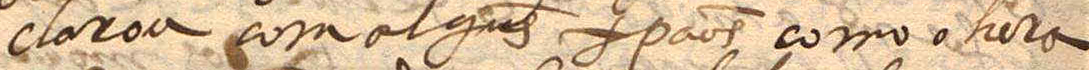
clarou com algūs Xpaõs como o hera
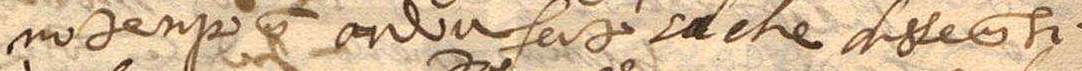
no tenpo q̄ andou feito Elche disse q̄ si
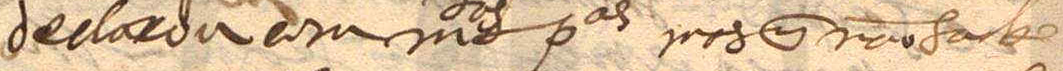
declarou com mtas pas mas q̄ não sabe
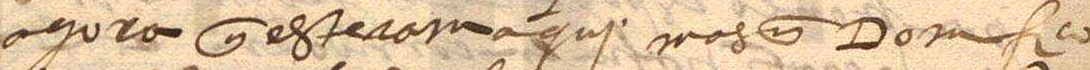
agora q̄ esteiam aquj mas q̄ Dom frco
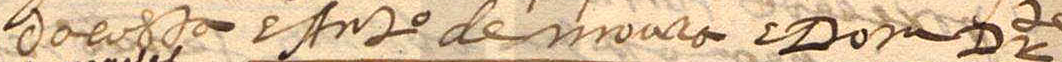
da costa E Anto de moura E Dom Drte
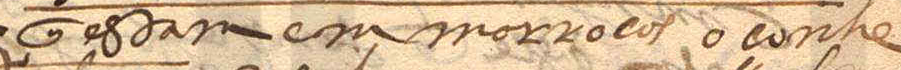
q̄ estam em marrocos o conhe
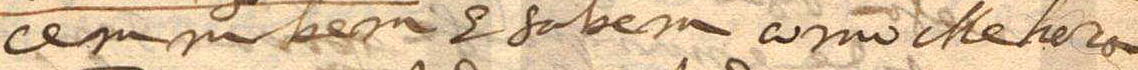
cem mto bem E sabem como elle hera
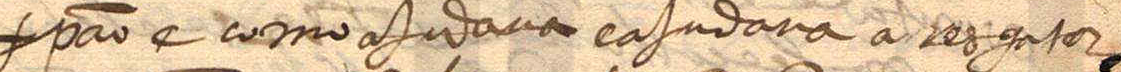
Xpaõ e como aJudaua e aJudara a resgatar
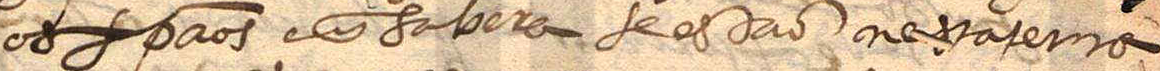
os Xpãos e q̄ sabera se estaõ nesta terra
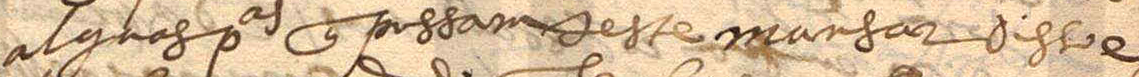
alguas pas q̄ possam testemunhar disso e
